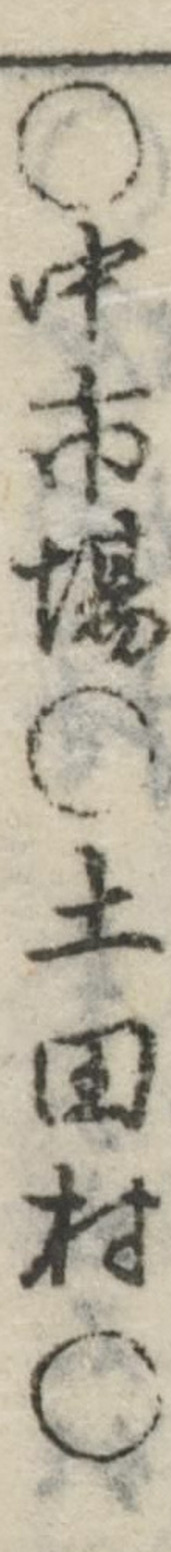○中市場○土田村○
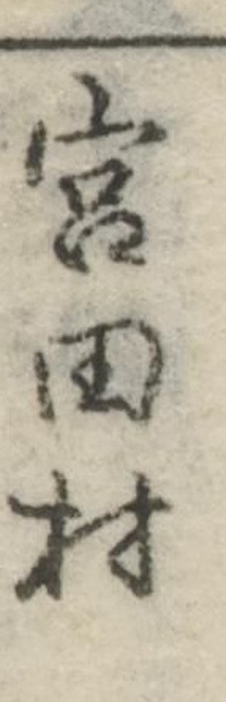宮田村

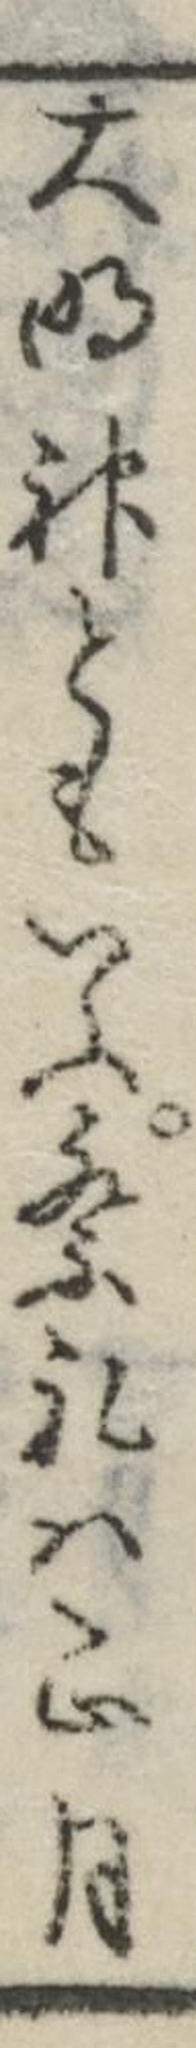大明神ともいふ。祭礼は正月
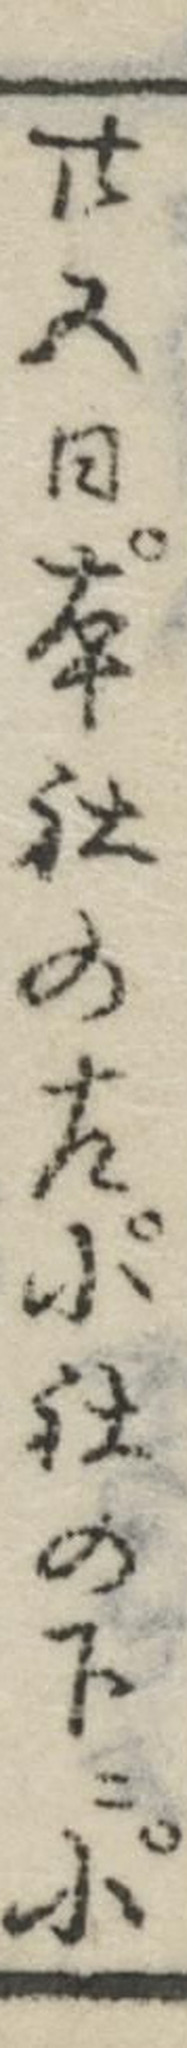廿五日。本社の左。小社の下に。小
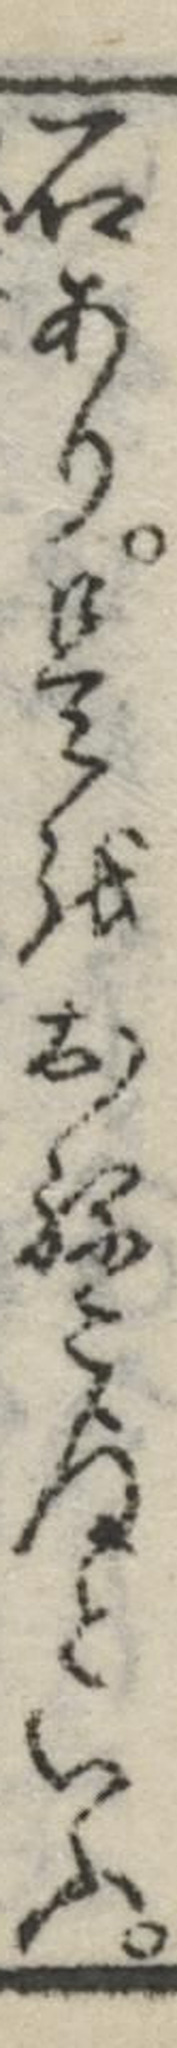石あり。是をおねこさまといふ。
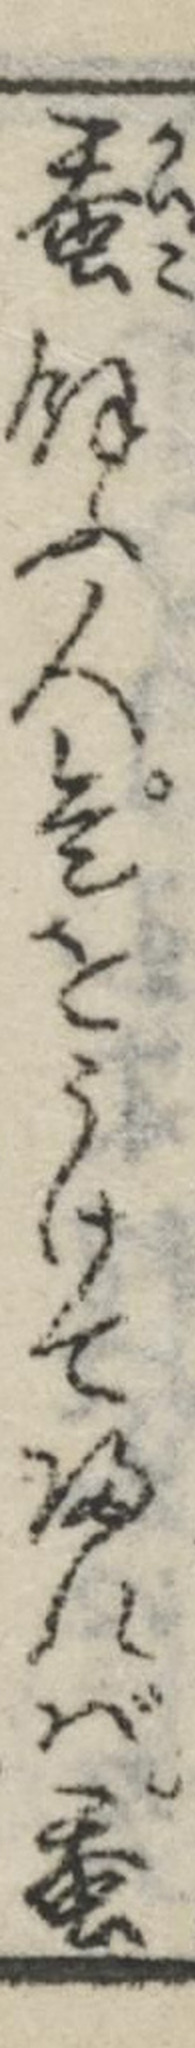蚕飼ふ人。是をうけて帰れば。蚕
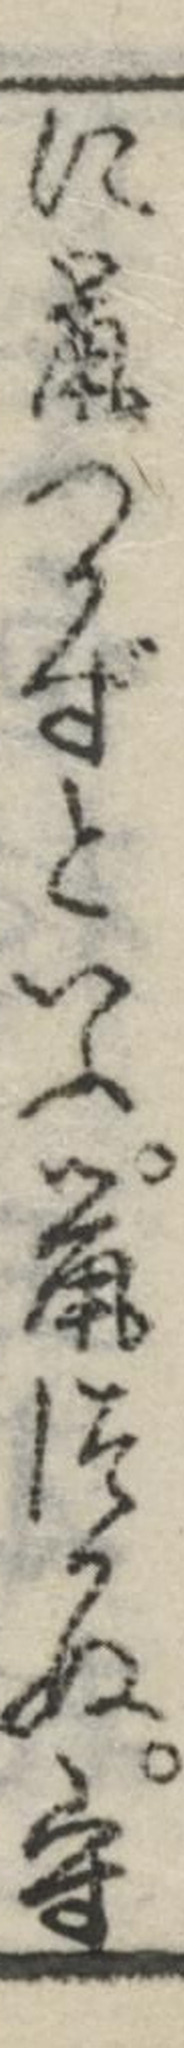に鼠つかずといふ。鼠つかぬ。守
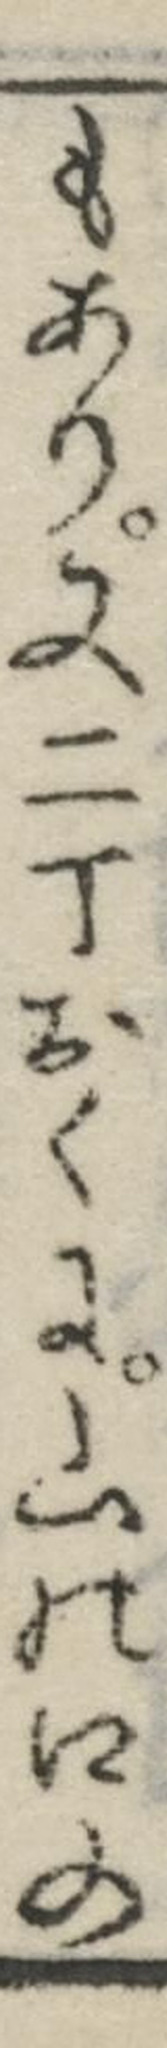もあり。又二丁おくに。山の口の
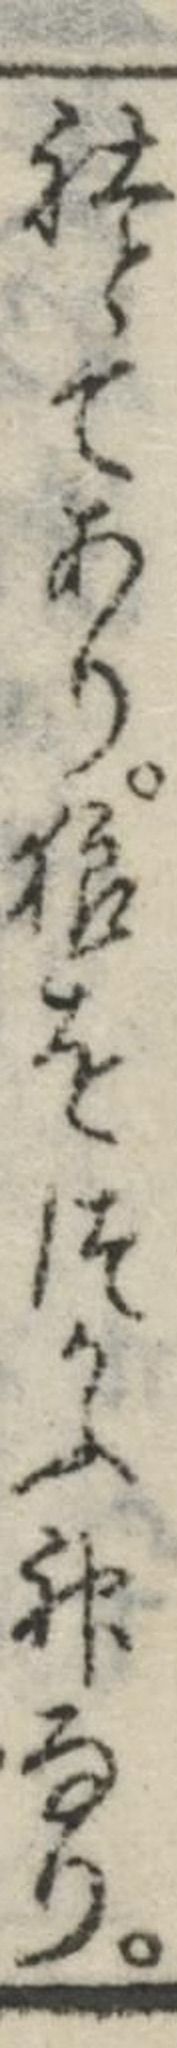社とてあり。狼をつかふ神なり。
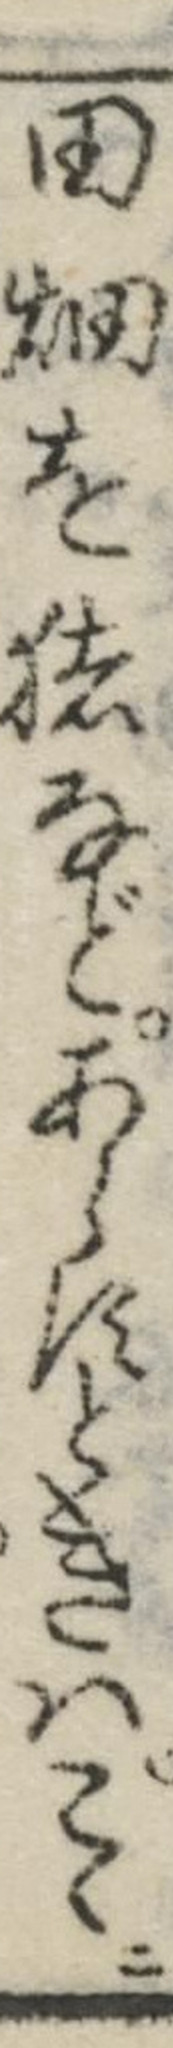田畑を猪など。あらすときは。こゝに
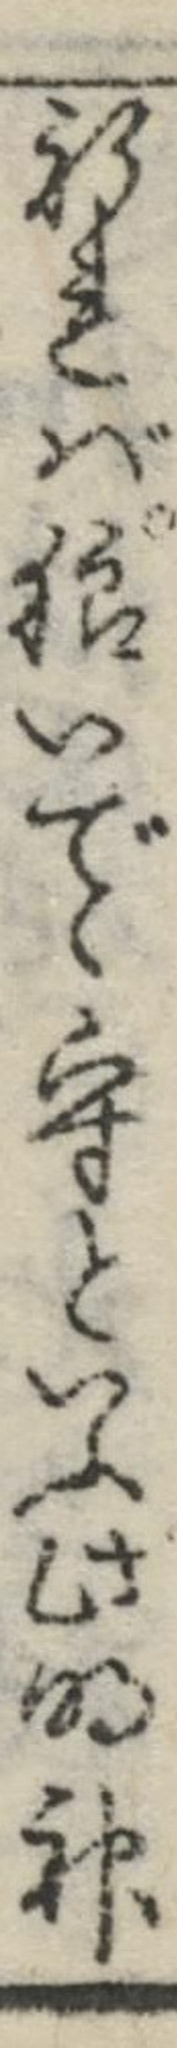祈れば。狼いでゝ守といふ。此明神
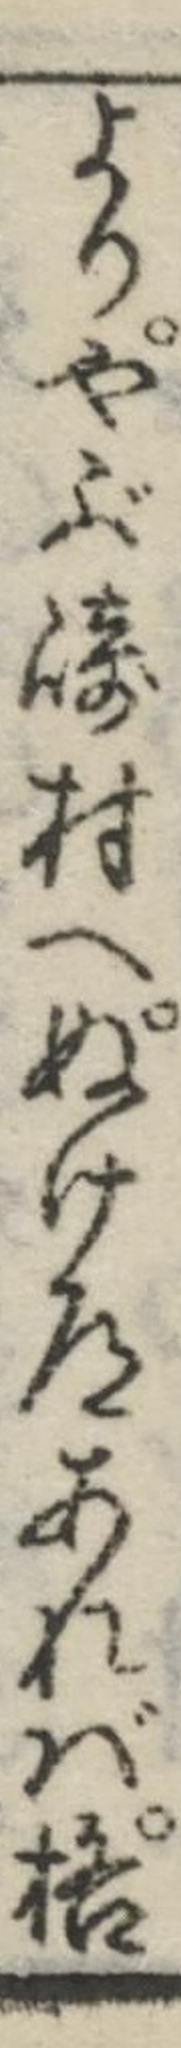より。やぶ崎村へ。ぬけ道あれば。格
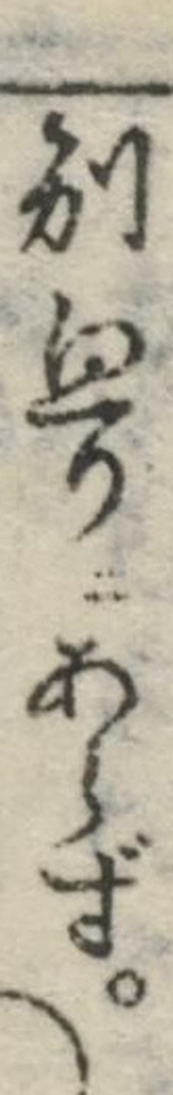別廻りにあらず。
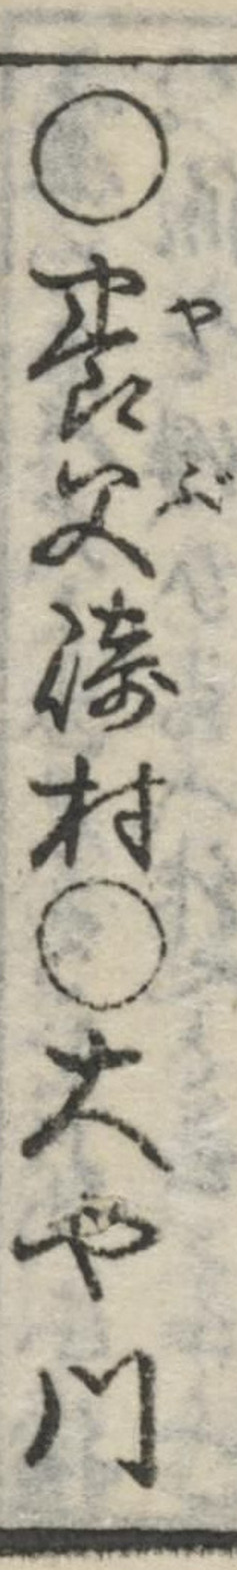○養父崎村○大や川
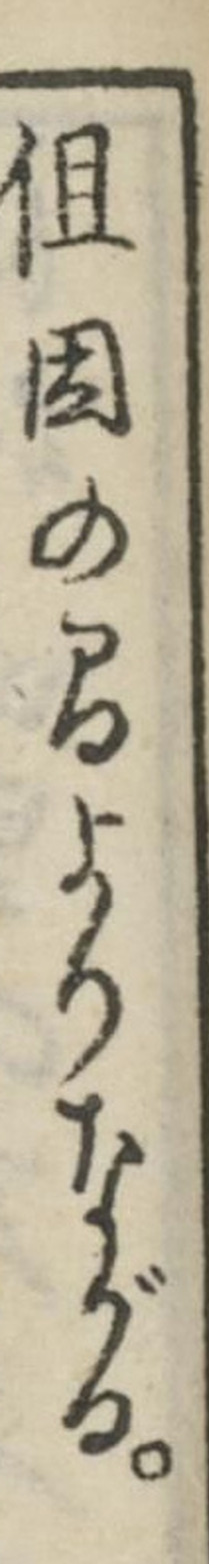但因の間よりながる。
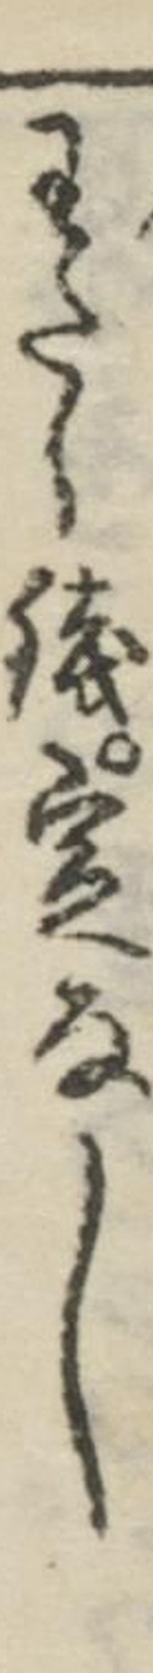わたし銭。定なし
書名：但州城崎浴湯辧
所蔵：東京大学地震研究所図書室 Earthquake Research Institute Library, The University of Tokyo, JAPAN
